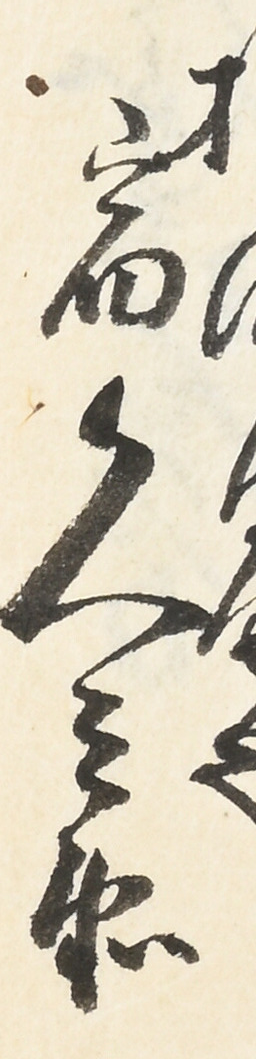宿宇兵衛
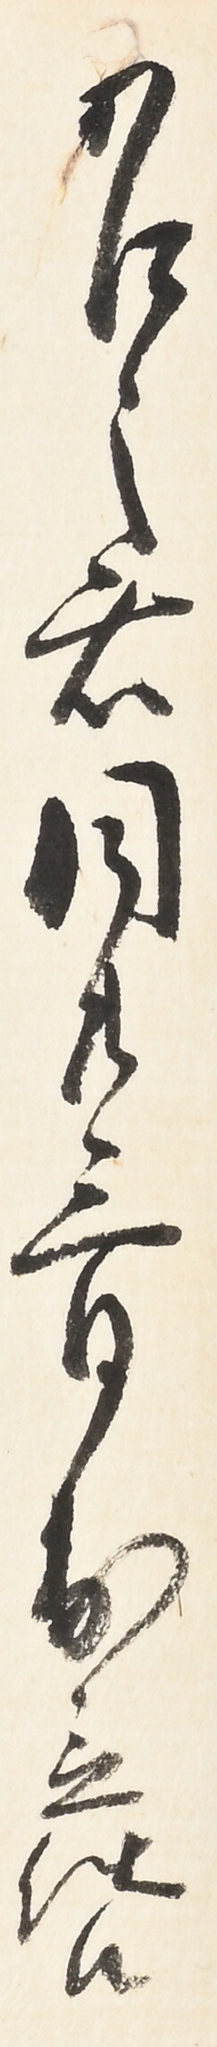右之者同廿三日出立仕候
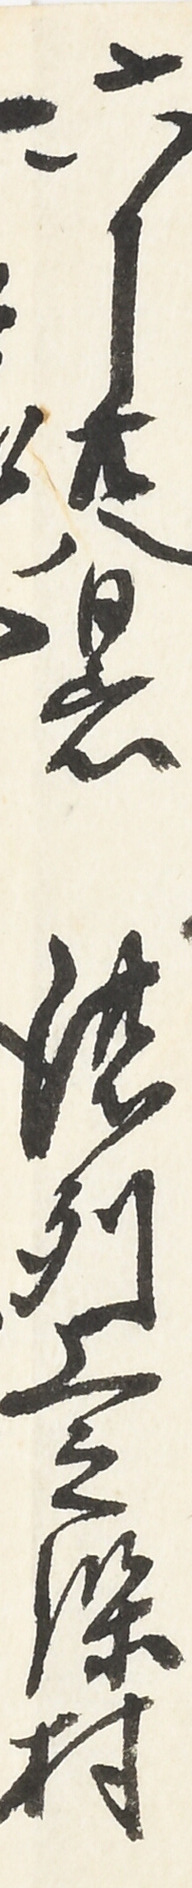六月廿八日着濃州上之保村
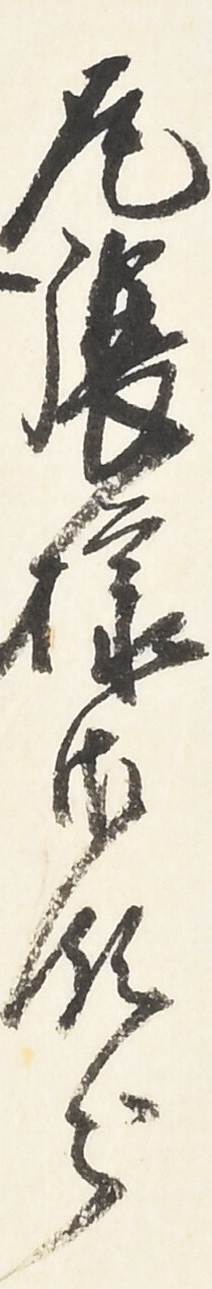尾張様御領分
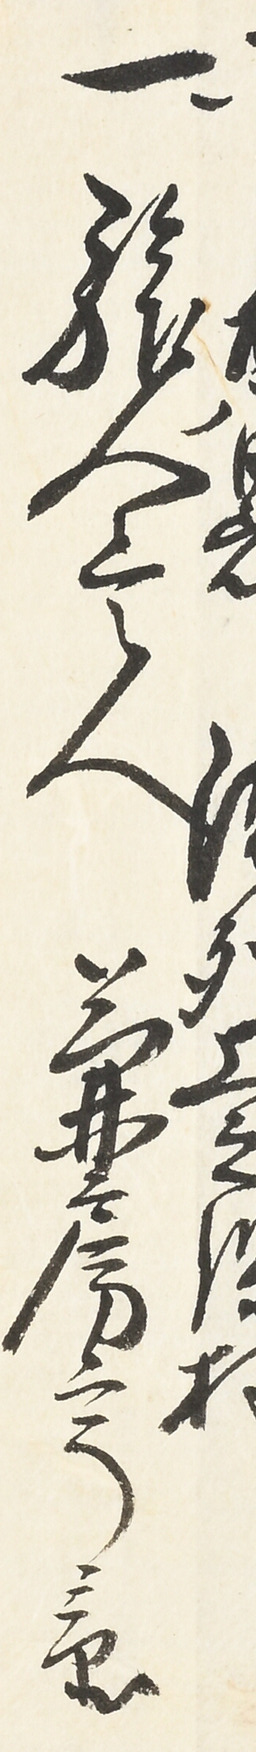一旅人壱人兼房宇兵衛
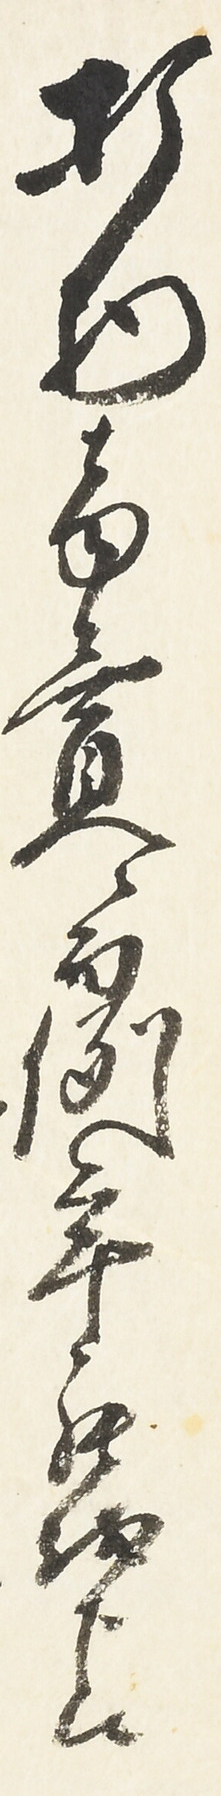打物商売ニ而例年罷越申候
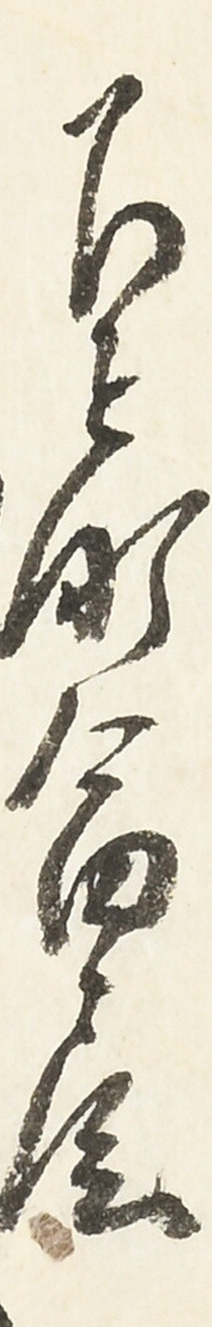下モ町冨屋
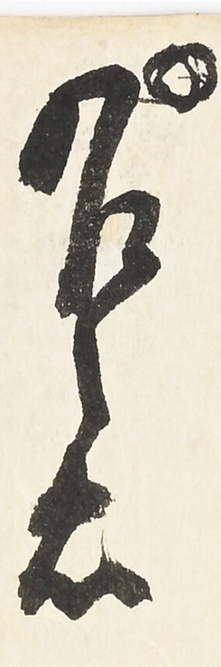右之者
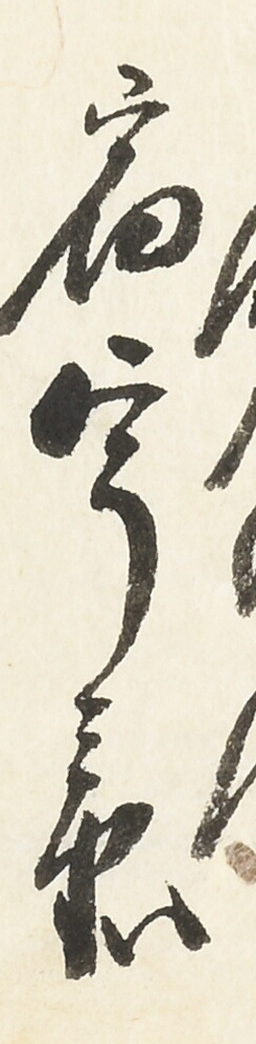宿宇兵衛
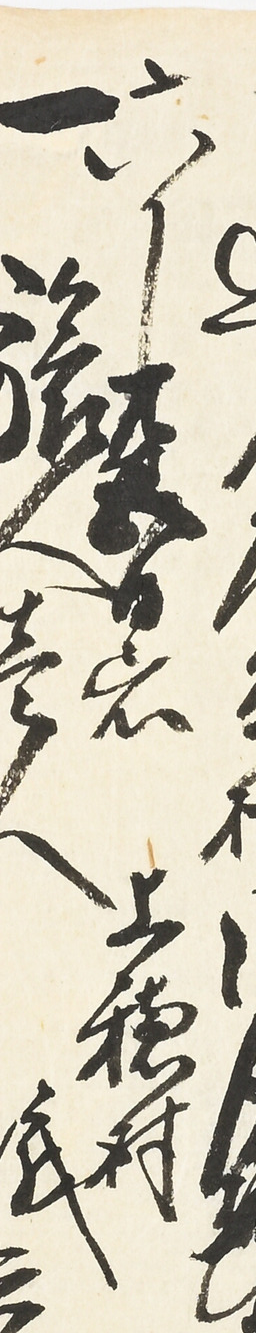六月廿五日着上穂村
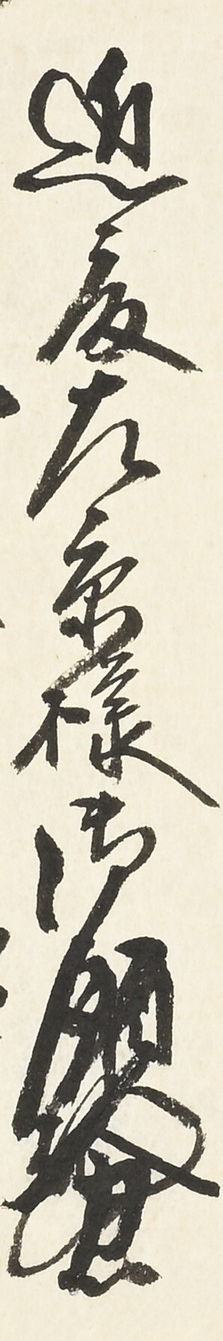近藤左京様御領分
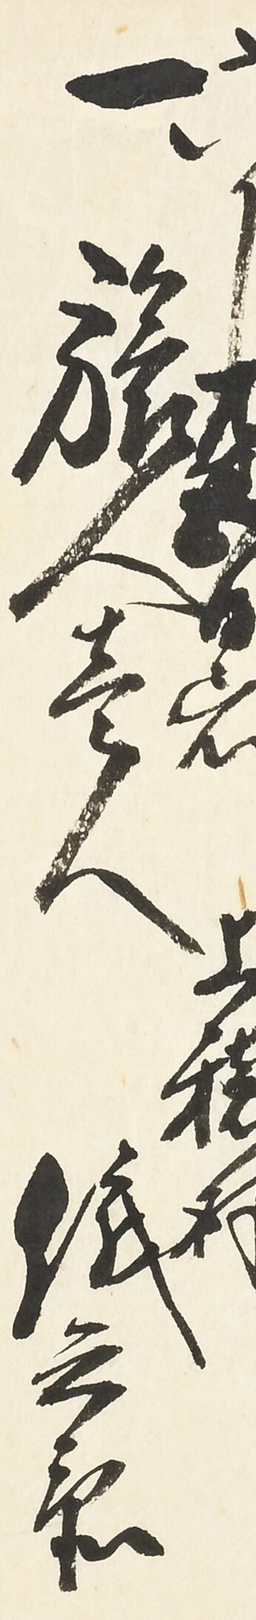一旅人壱人儀兵衛
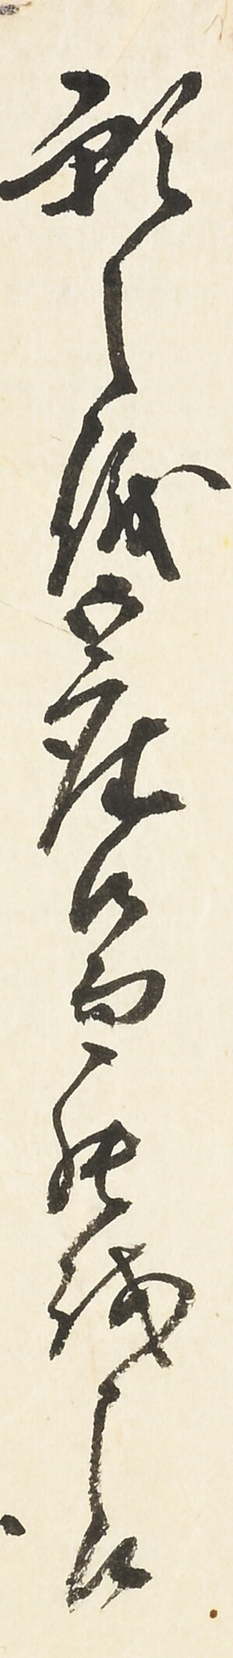願之儀御座候而罷越申候
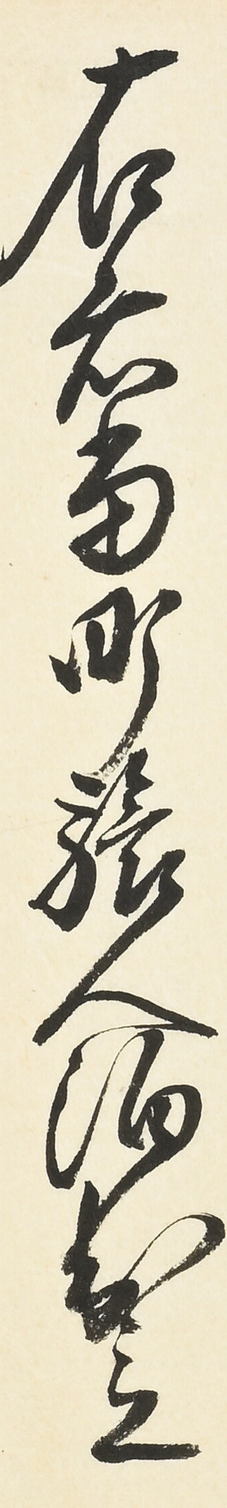右者当町旅人泊出立
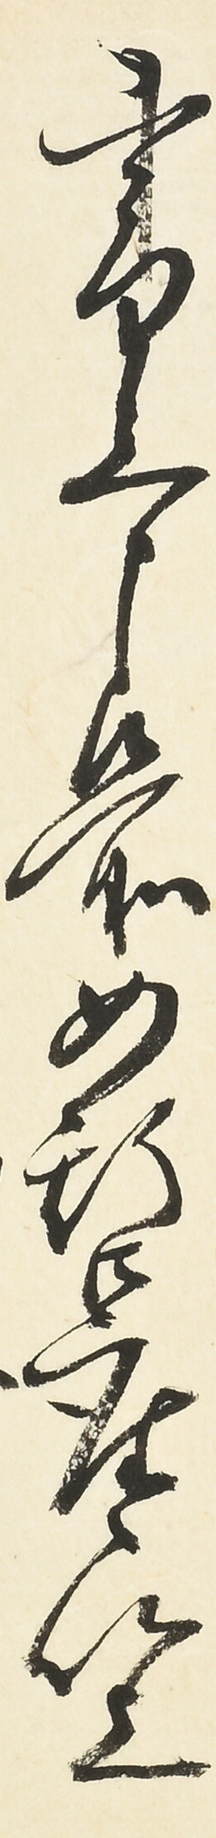書上申候所如斯御座候以上
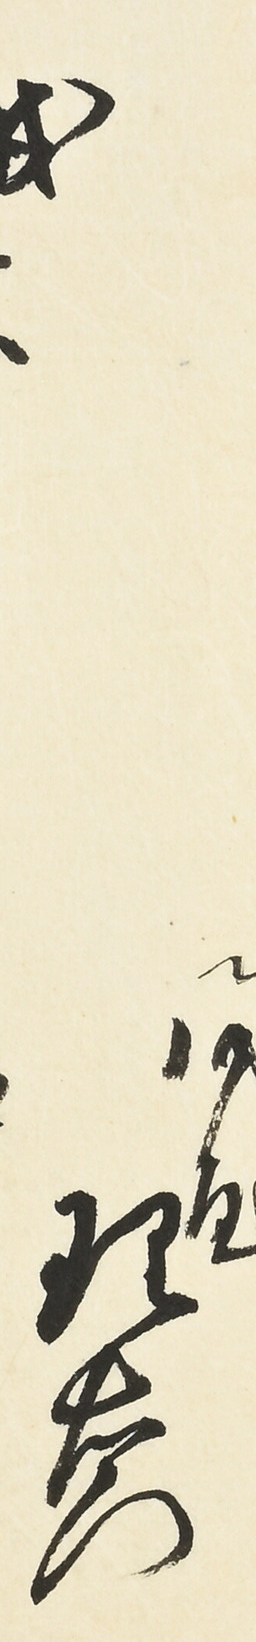宿兵右衛門
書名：町中旅人泊控帳
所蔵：伊那市立高遠町図書館・合同会社AMANE
